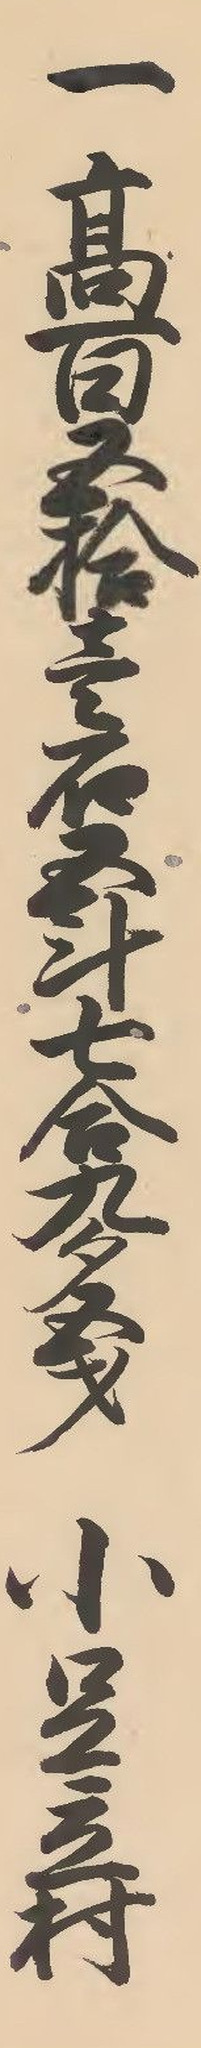一高百五拾壱石五斗七合九勺五才小足立村

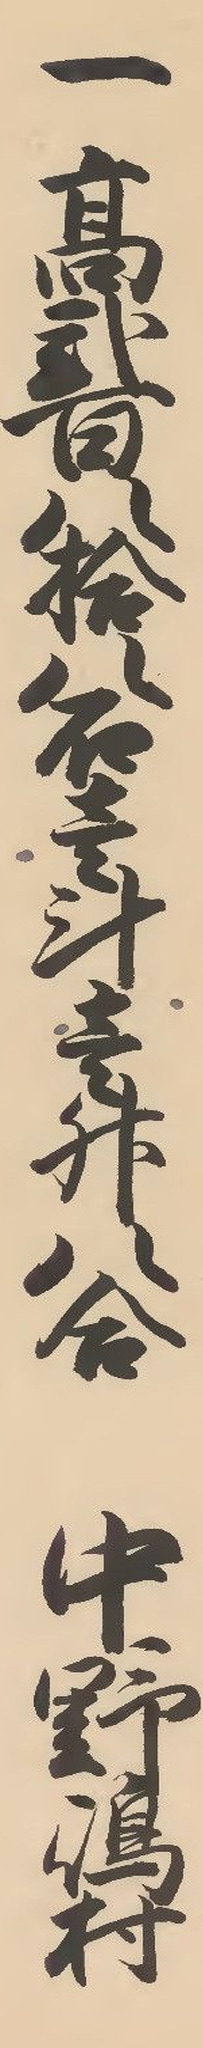一高弐百八拾八石壱斗壱升八合中野嶋村
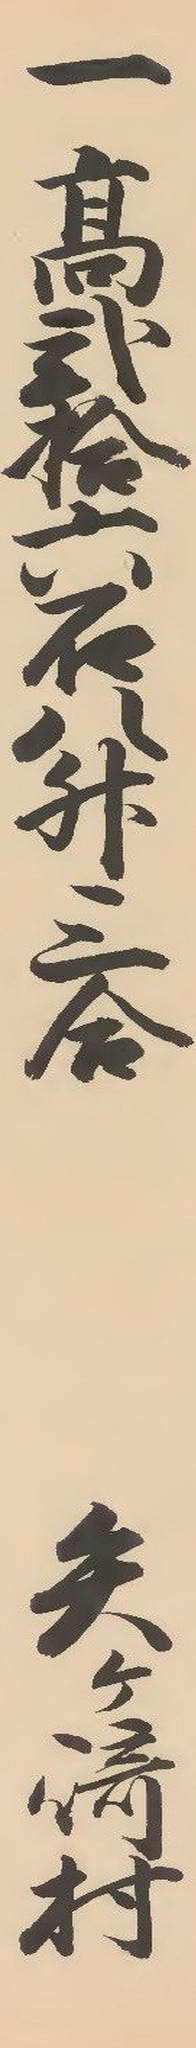一高弐拾六石八升三合矢ヶ崎村
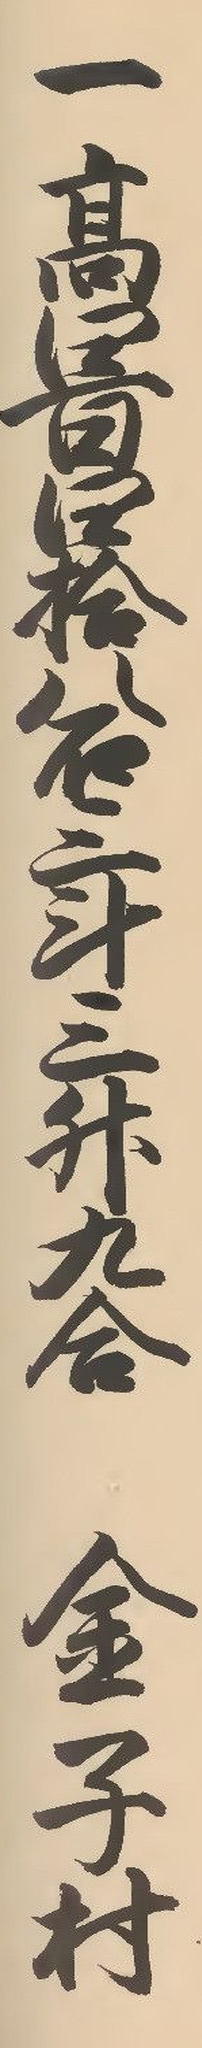一高四百四拾八石三斗三升九合金子村
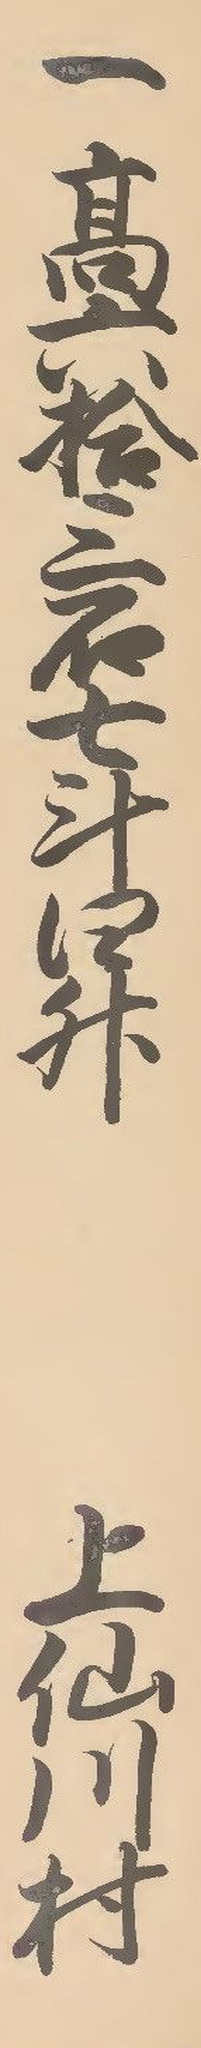一高六拾三石七斗四升上仙川村
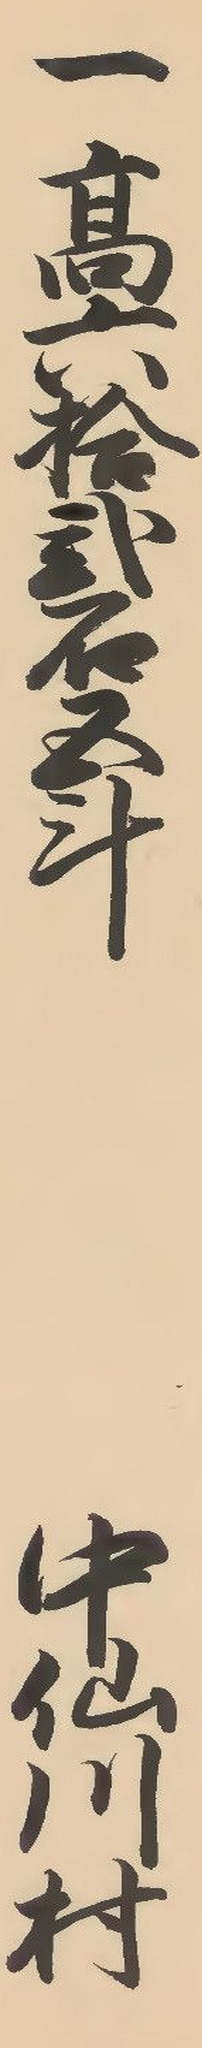一高六拾弐石五斗中仙川村
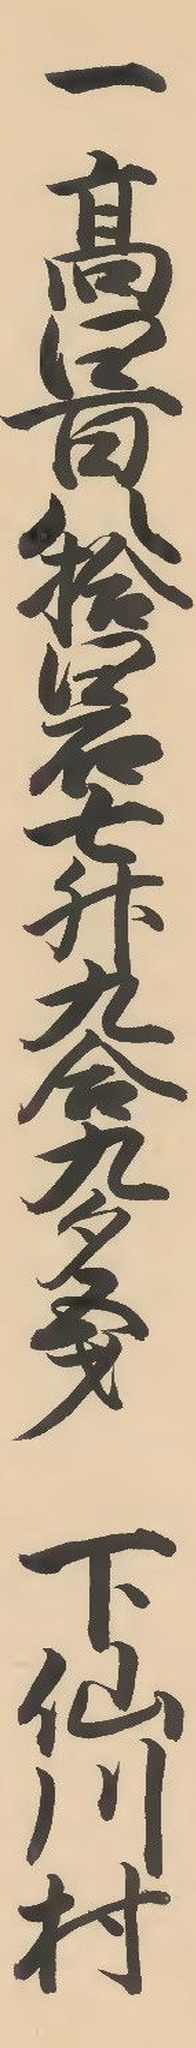一高四百八拾四石七升九合九勺五才下仙川村
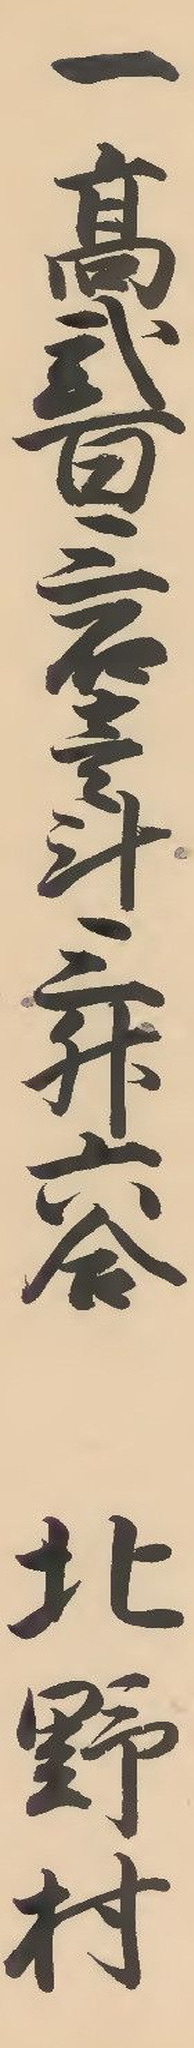一高弐百三石壱斗三升六合北野村

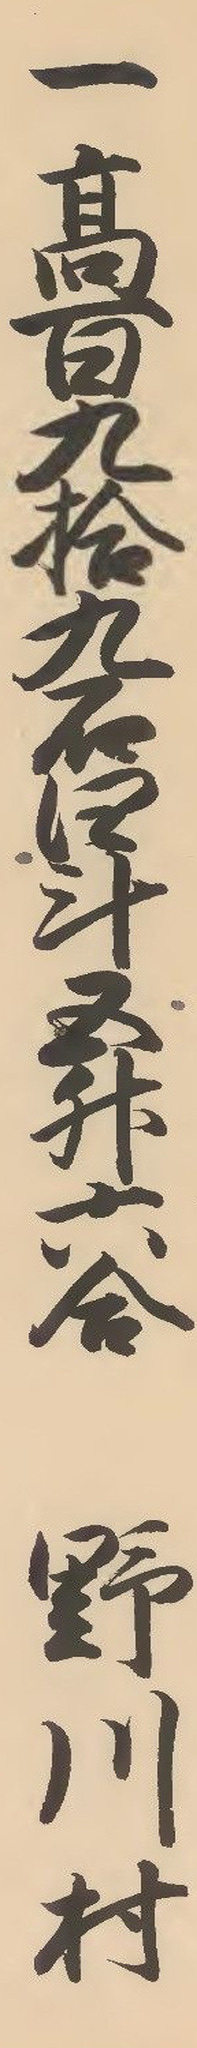一高百九拾九石四斗五升六合野川村
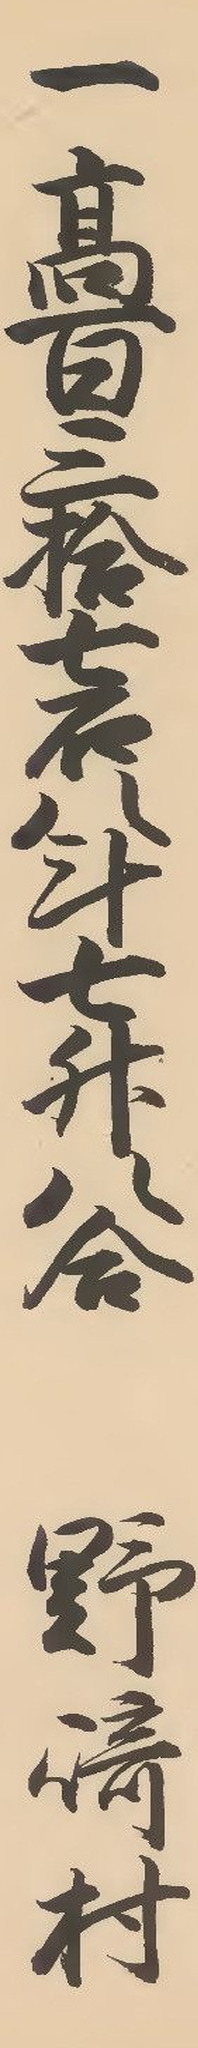一高百三拾七石八斗七升八合野崎村
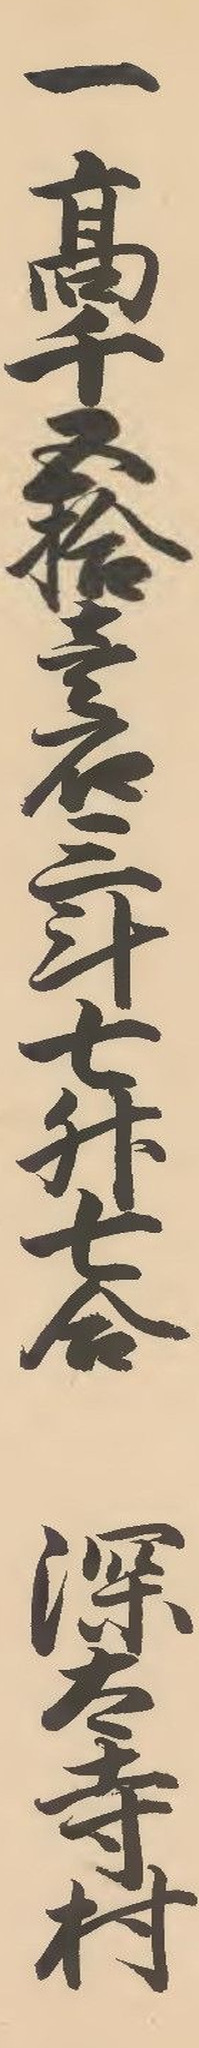一高千五拾壱石三斗七升七合深太寺村
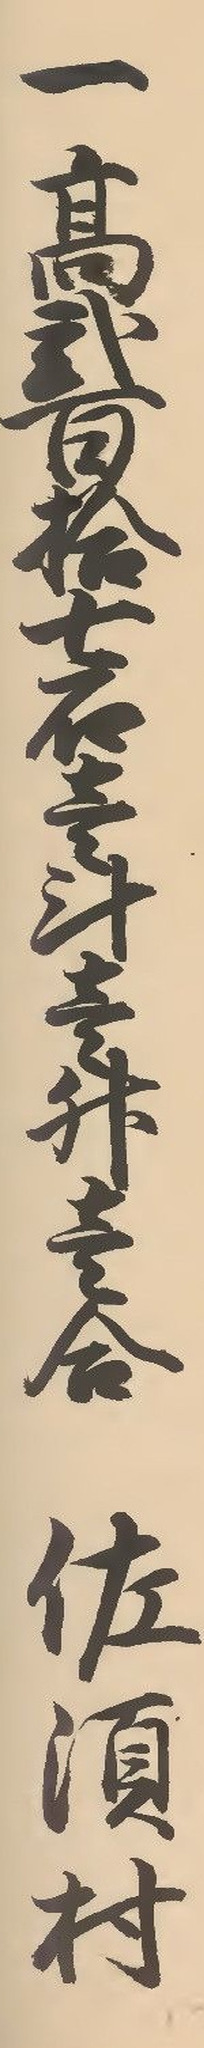一高弐百拾七石壱斗壱升壱合佐須村
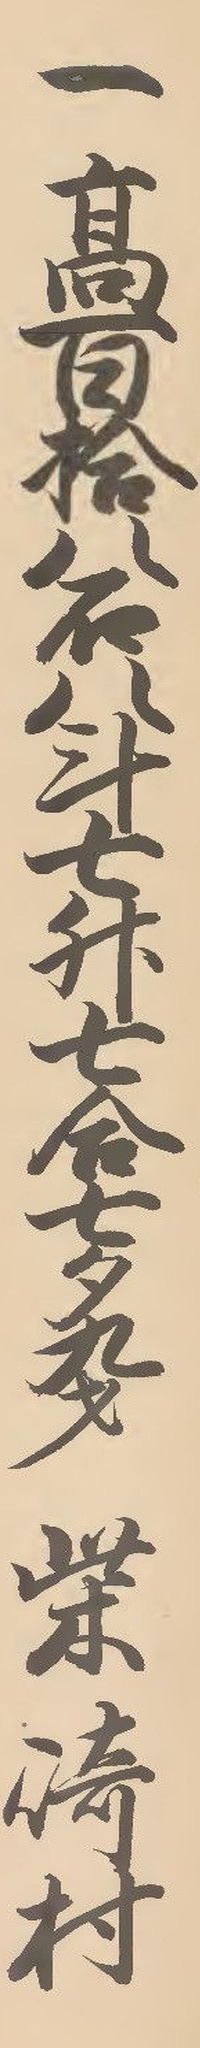一高百拾八石八斗七升七合七勺九才柴崎村
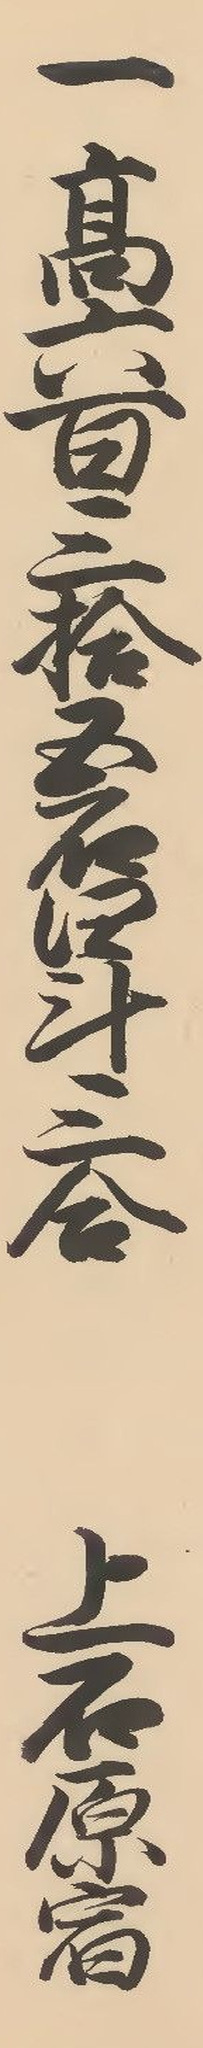一高六百三拾五石四斗三合上石原宿
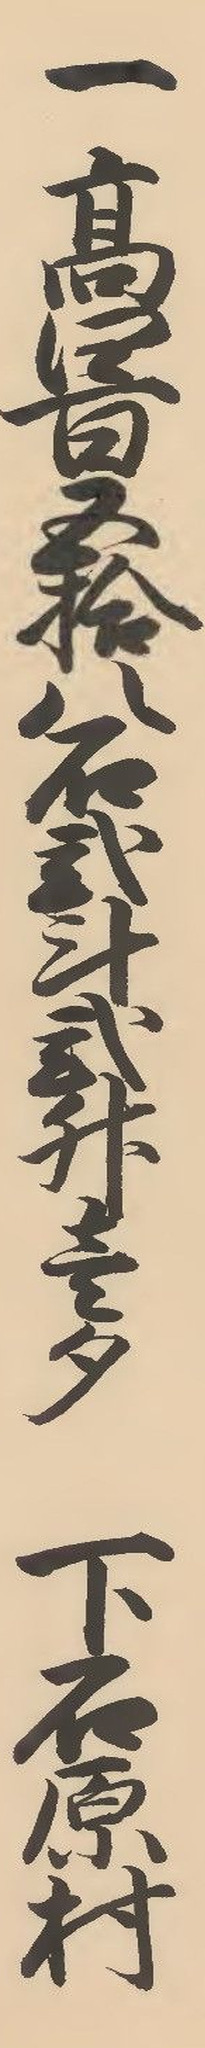一高四百五拾八石弐斗弐升壱勺下石原村
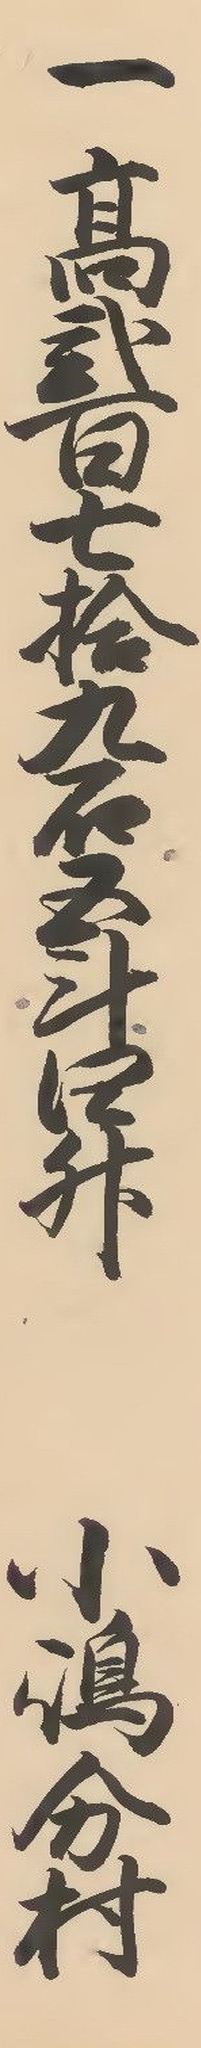一高弐百七拾九石五斗四升小嶋分村
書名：武蔵国郷帳　上
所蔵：国立公文書館 National Archives of Japan
